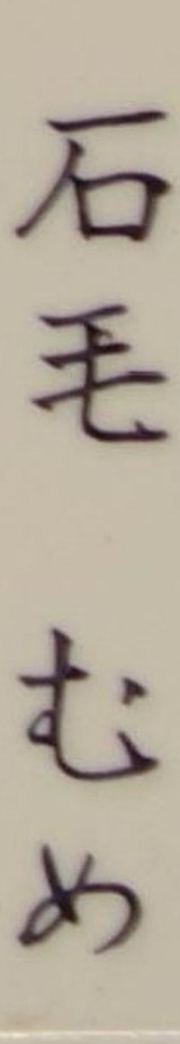石毛むめ
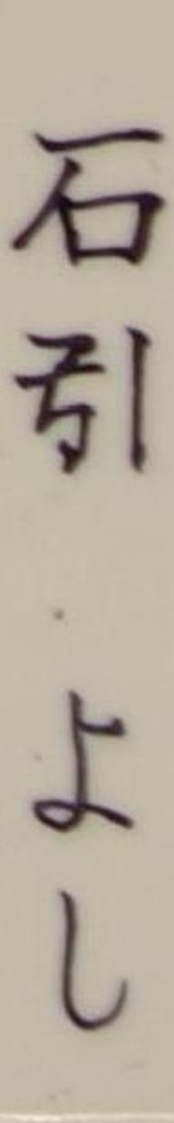石引よし
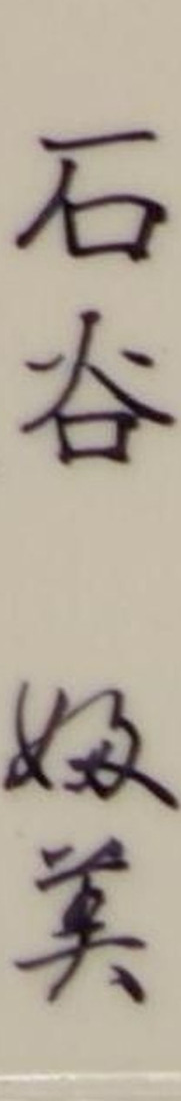石谷ふみ
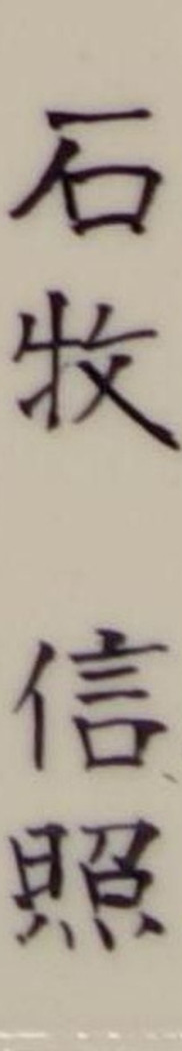石牧信照
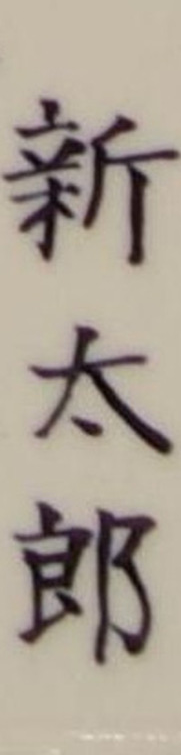新太郎
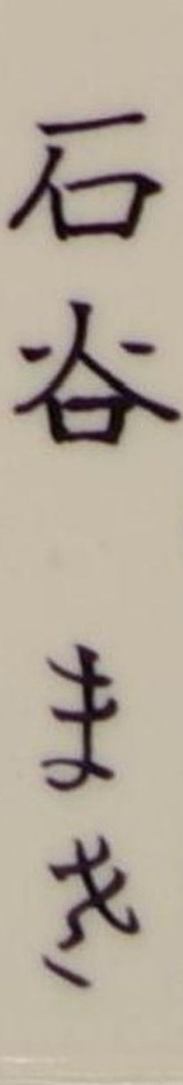石谷まさ
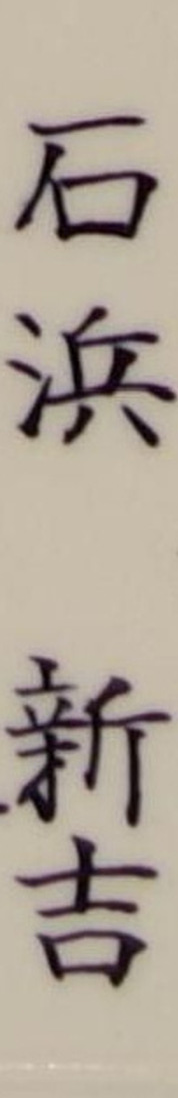石浜新吉
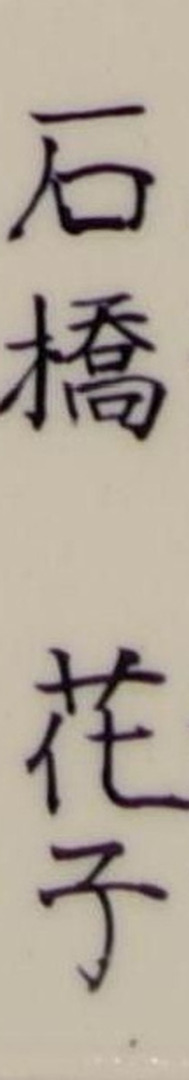石橋花子
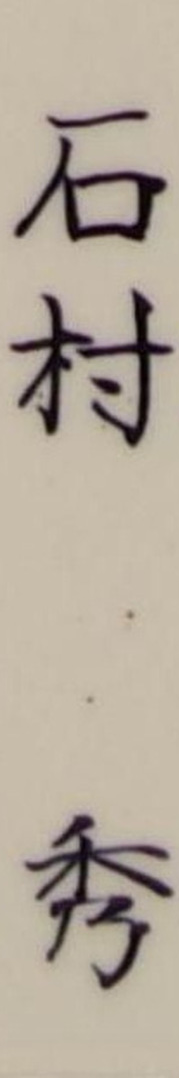石村秀
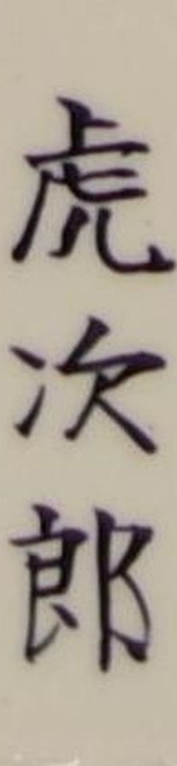虎次郎
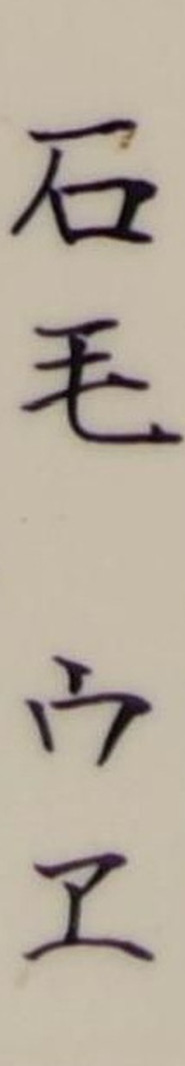石毛ウヱ
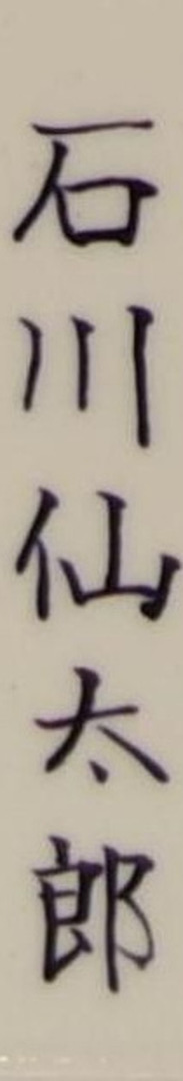石川仙太郎
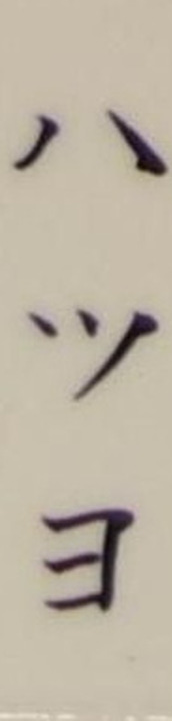ハツヨ
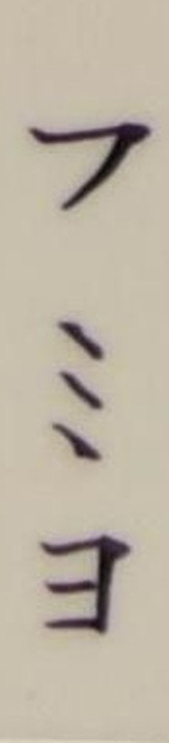フミヨ
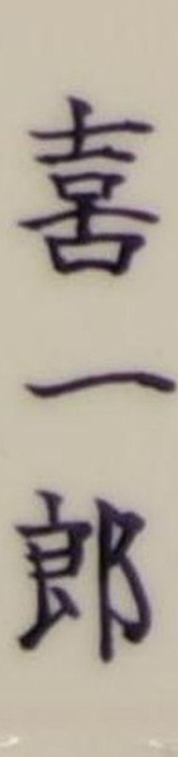喜一郎
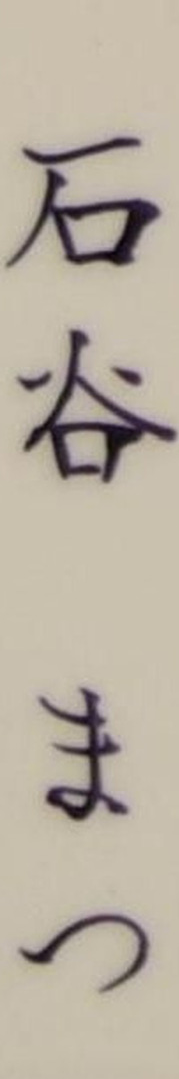石谷まつ
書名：M~S
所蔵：高野山金剛峯寺
